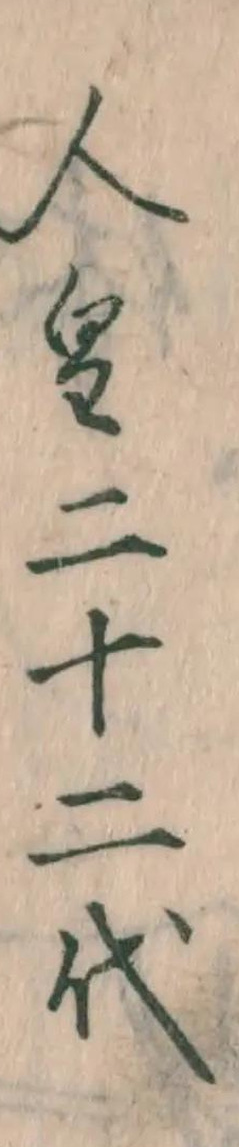人皇二十二代
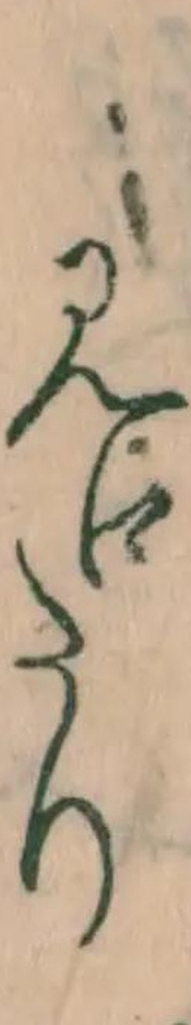見えたり
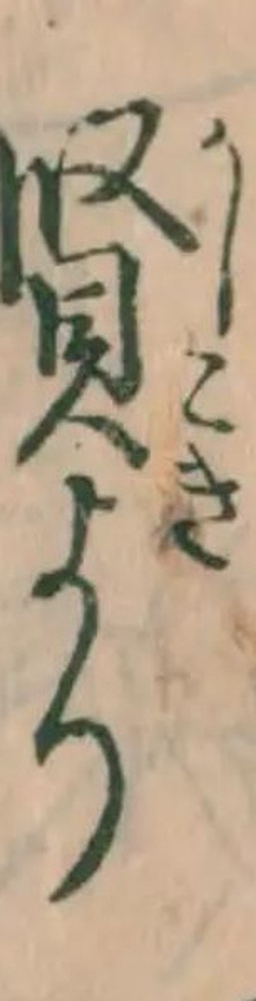賢より
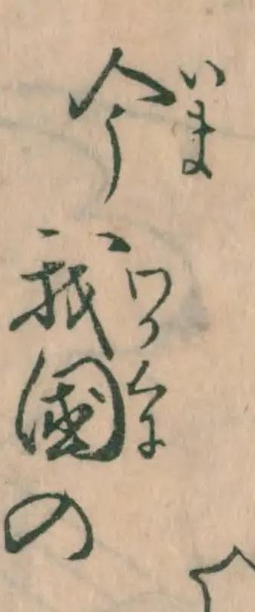今我国の
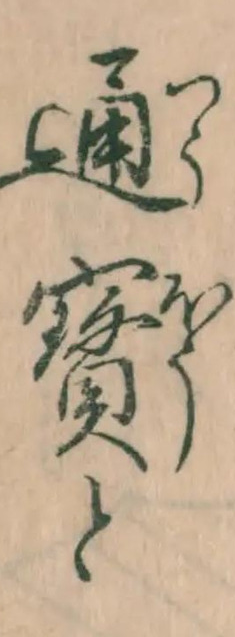通宝と
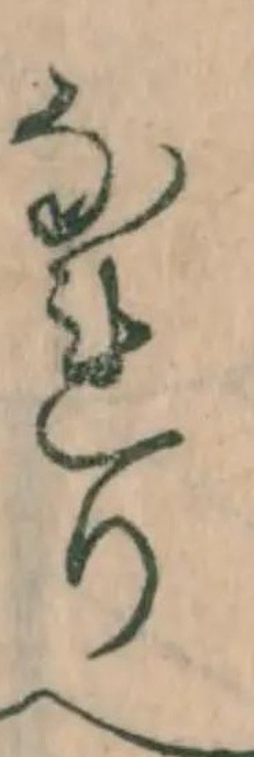なれり

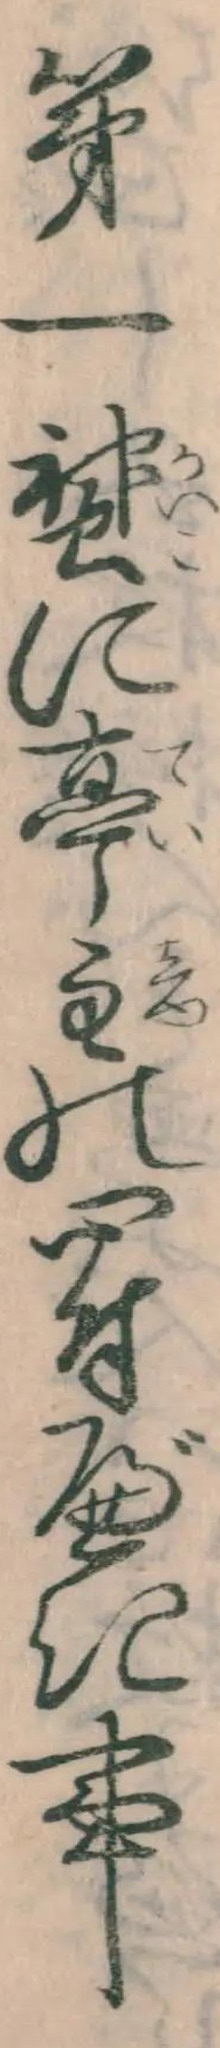第一䗝に亭主の心付べき事
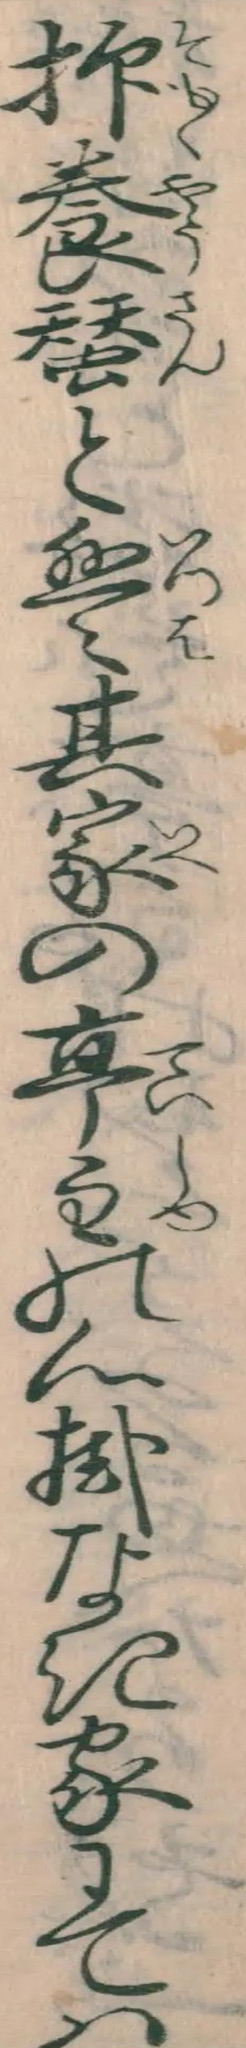抑養蚕とは其家の亭主の心掛なき家にては
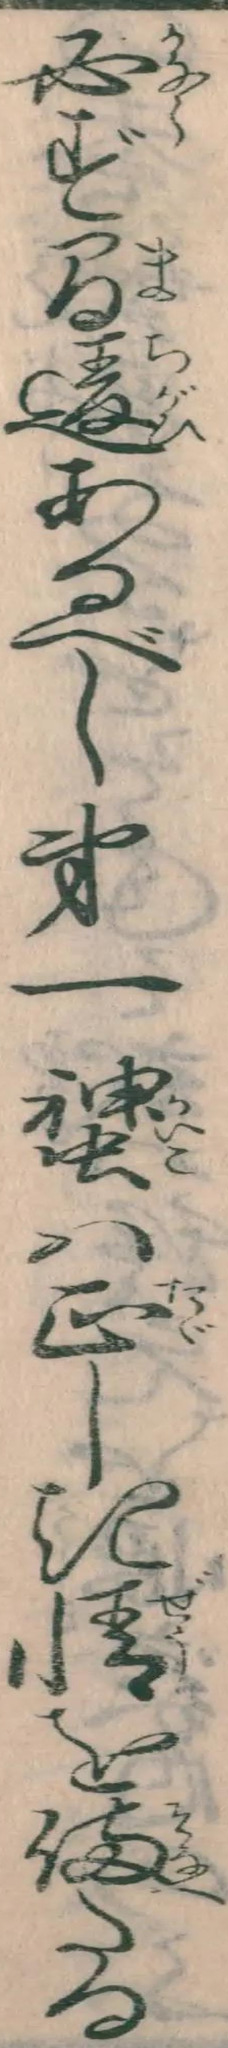必ず間違あるべし第一䗝は正しき情を備たる
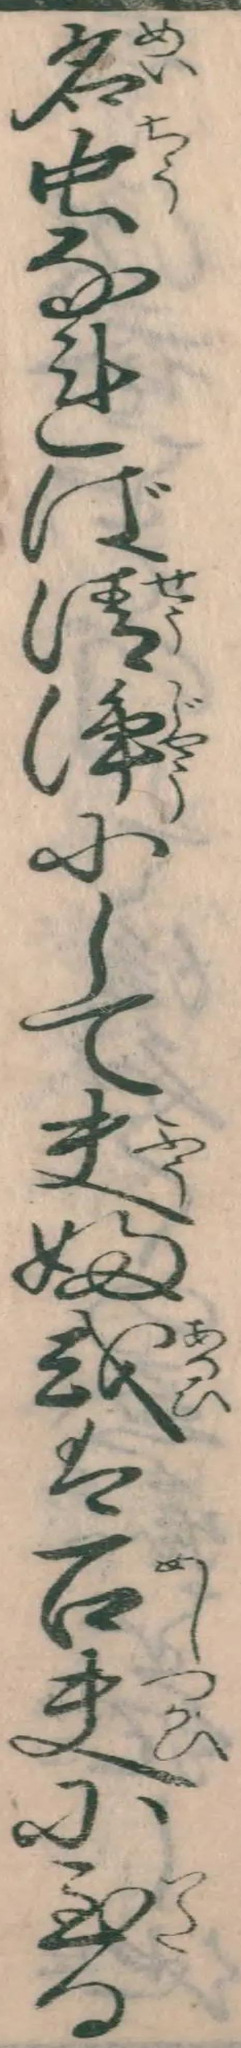名虫なれば清浄にして夫婦或は召夫に至る
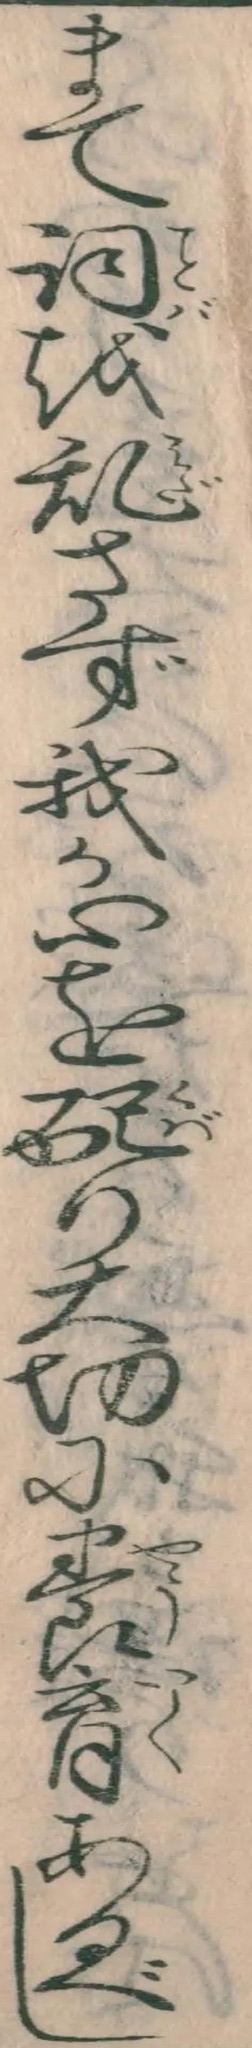まて詞を乱さず我か心を配り大切に養育あるべし
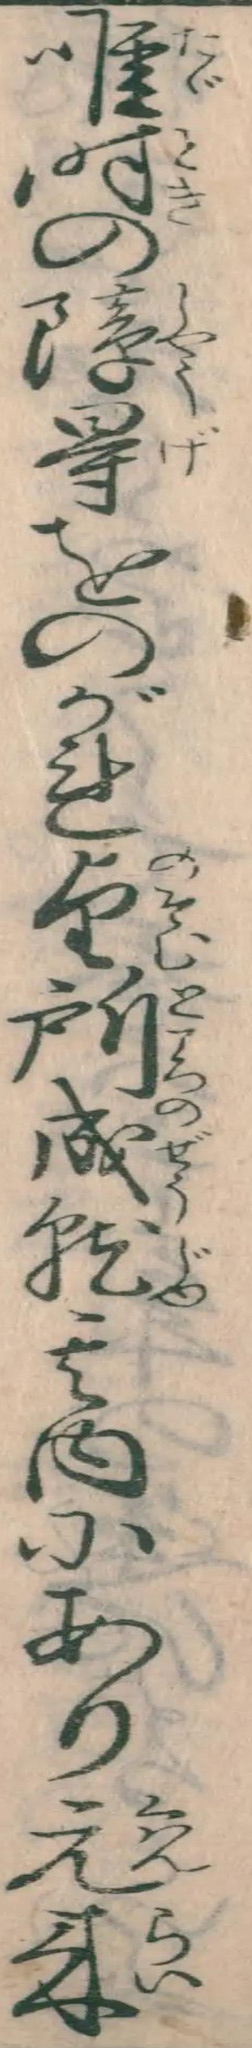唯時の障㝵をのがれ望所成就其内にあり元来
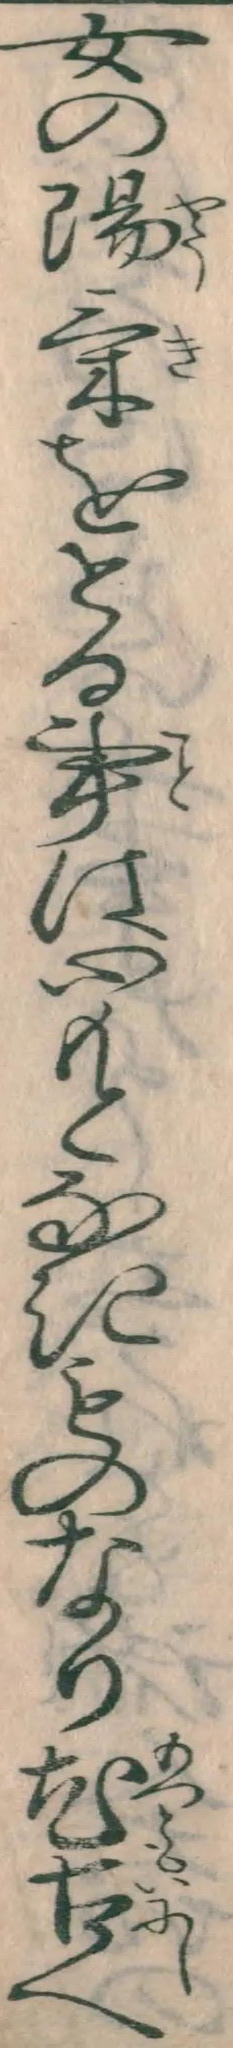女の陽気をとる事は心もとなきものなり尤古へ
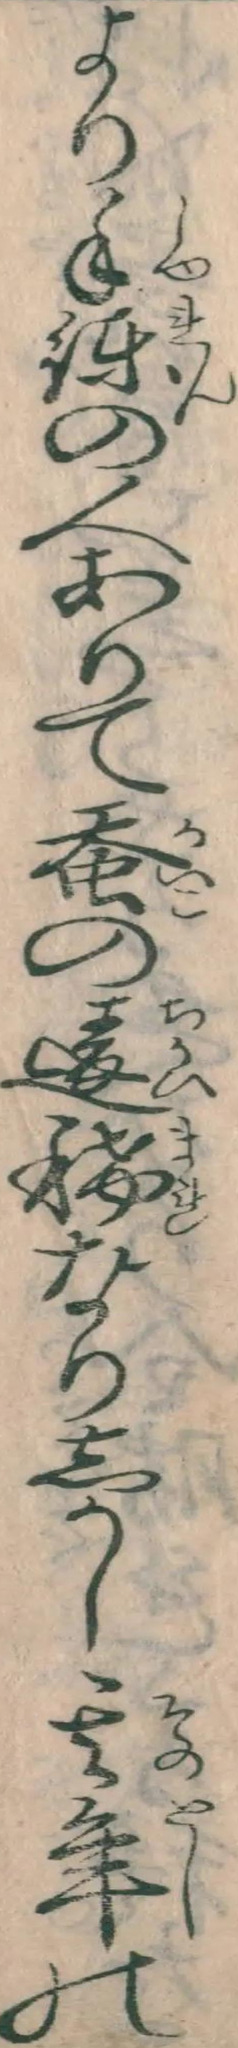より手練の人ありて蚕の違稀なりしかし其年の
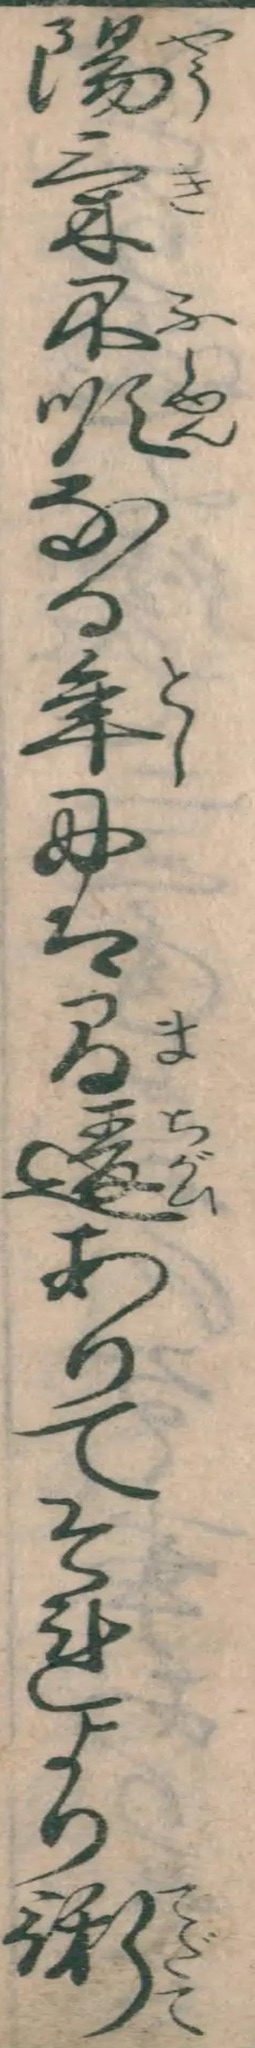陽気不順なる年には間違ありてそれより術

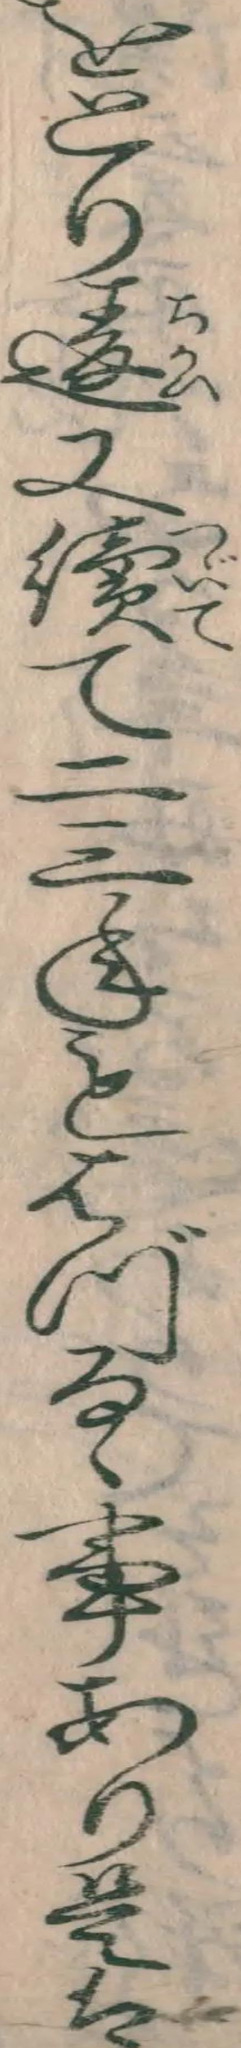をとり違又続二三年もはづるゝ事あり是は
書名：新撰養蚕秘書
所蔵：国立国会図書館 National Diet Library, JAPAN
